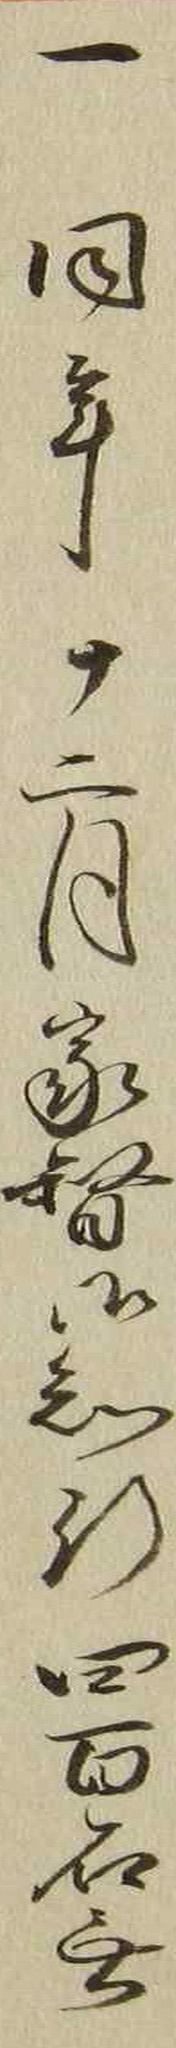一同年十二月家督御知行四百石無
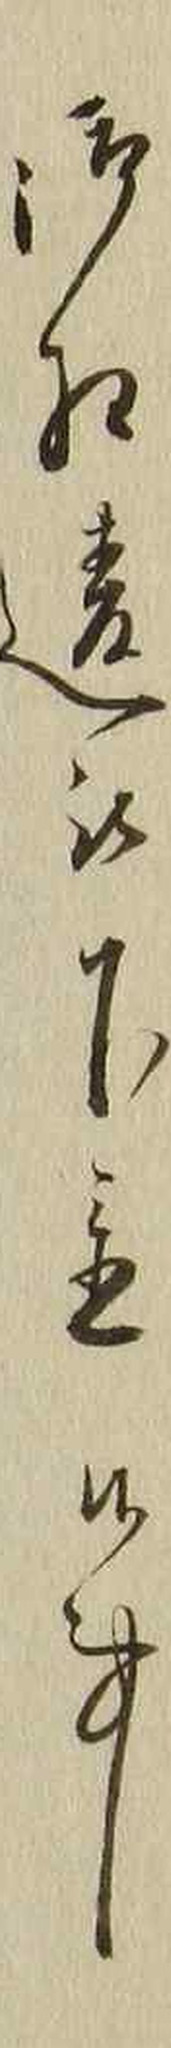御相違被下置候事
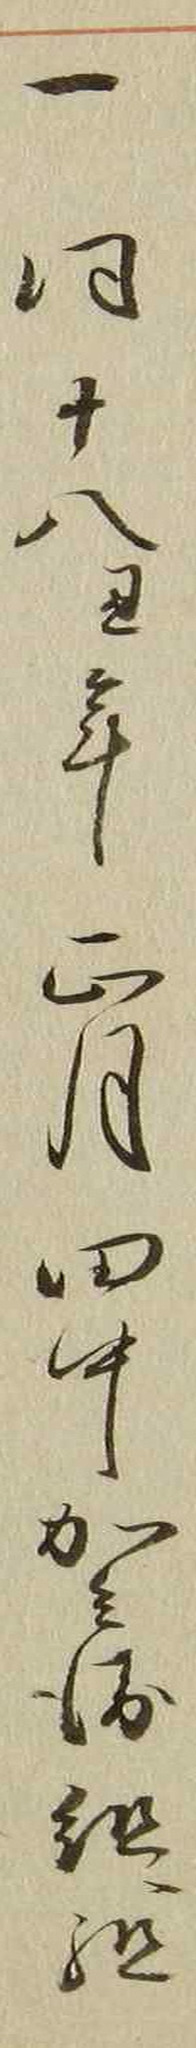一同十八丑年正月田中加兵衛組へ組
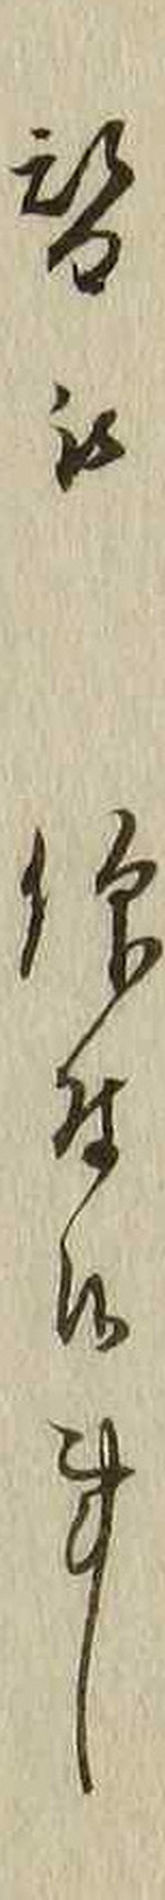替被仰付候事
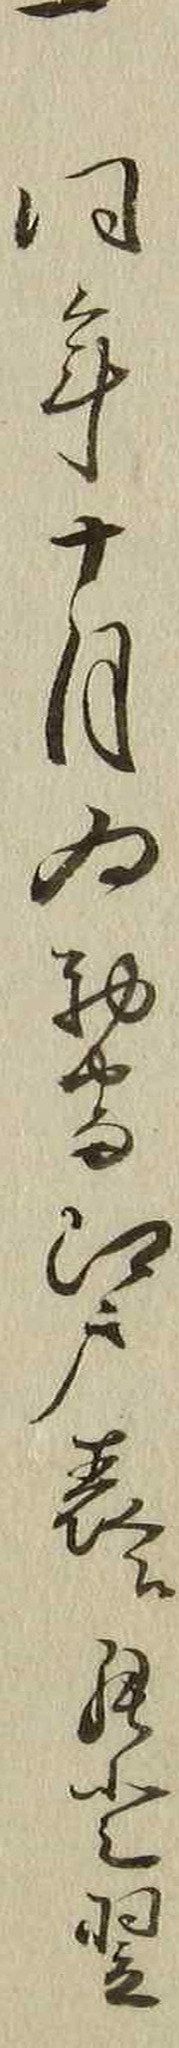一同年十月為勤番江戸表江罷登翌
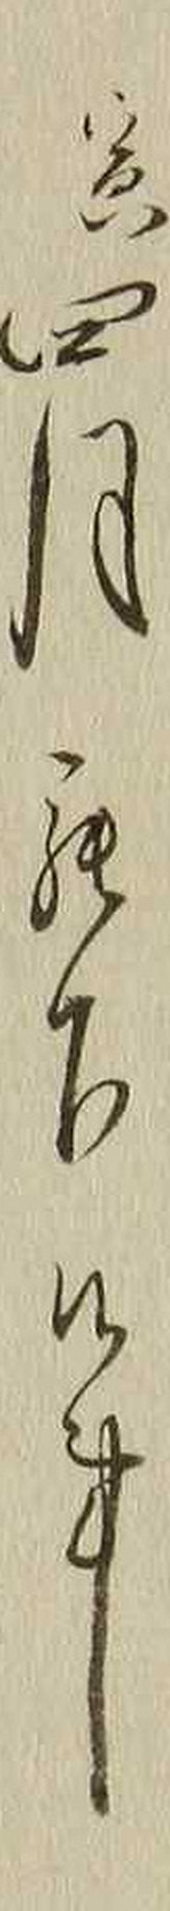寅四月罷下候事
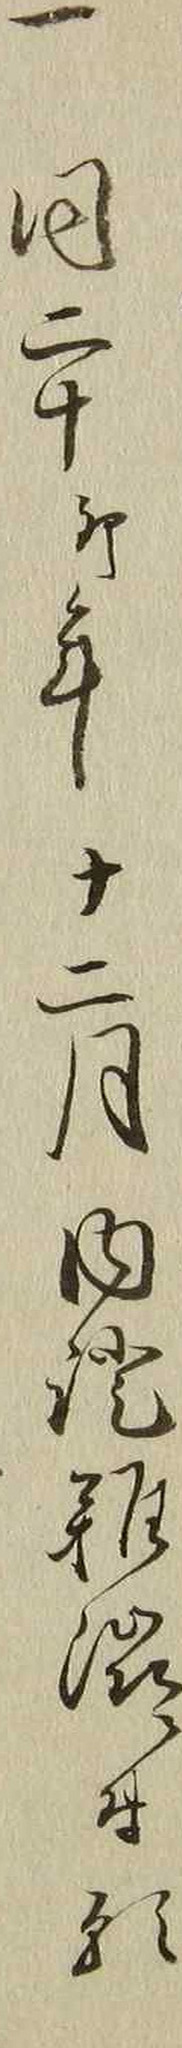一同二十卯年十二月内証難渋ニ付願
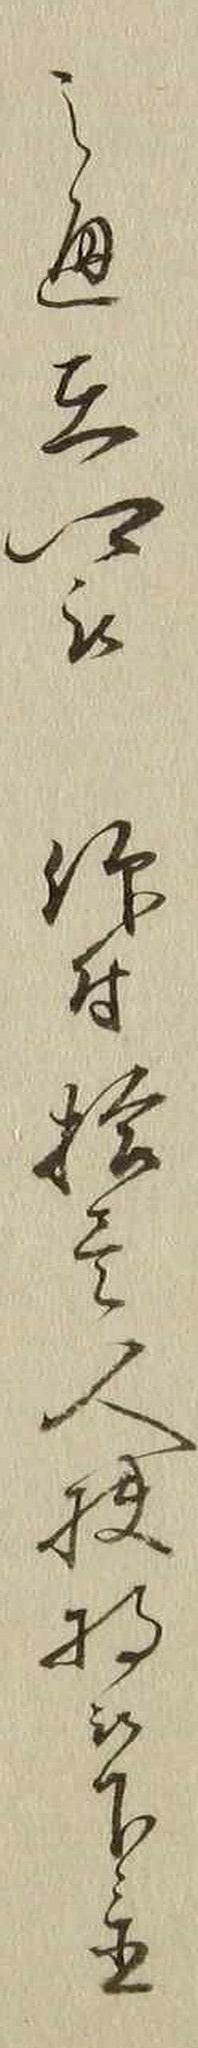之通在郷被仰付拾壱人扶持被下置
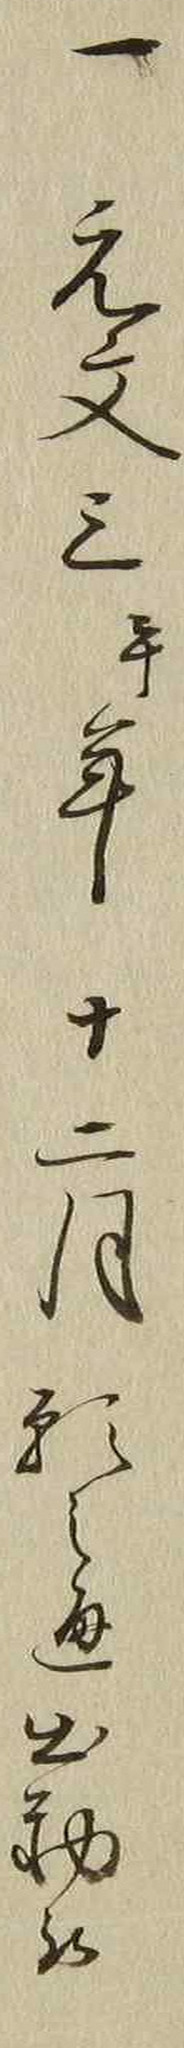一元文三午年十二月願之通出勤被
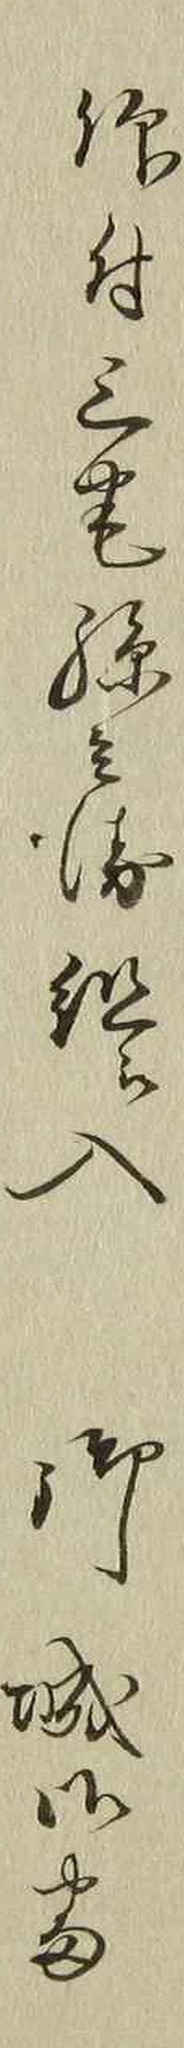仰付三宅孫兵衛組江入御城御番
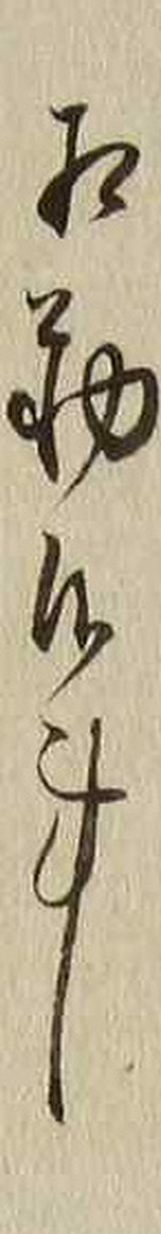相勤候事
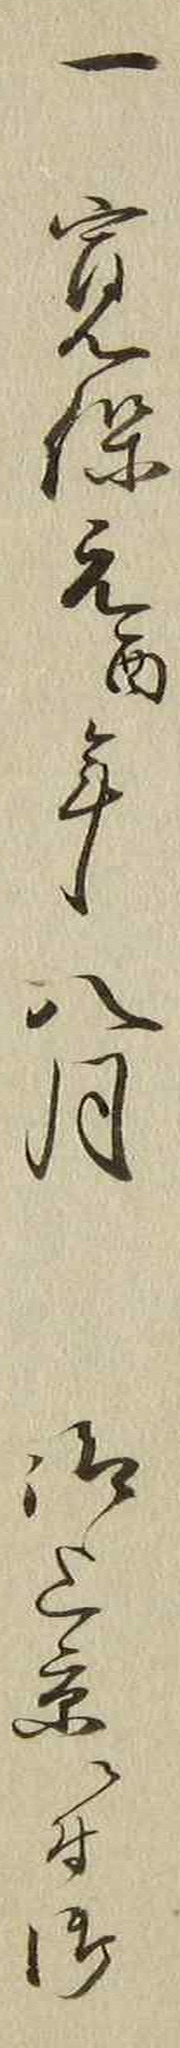一寛保元酉年八月御上京ニ付御
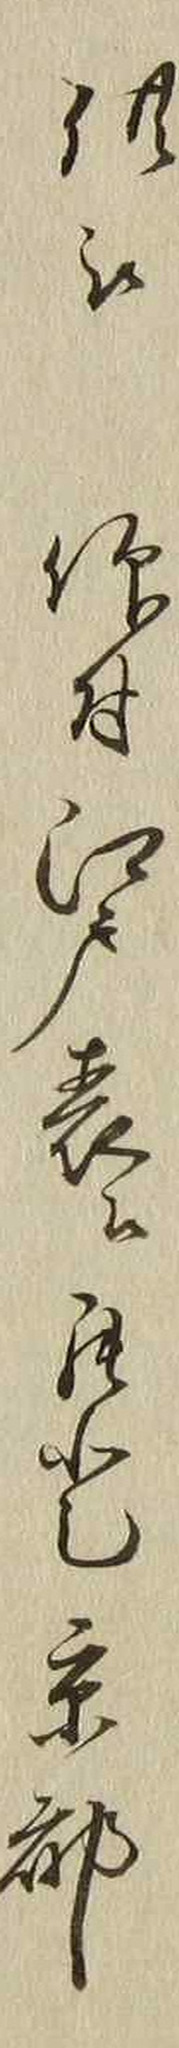供被仰付江戸表江罷登京都
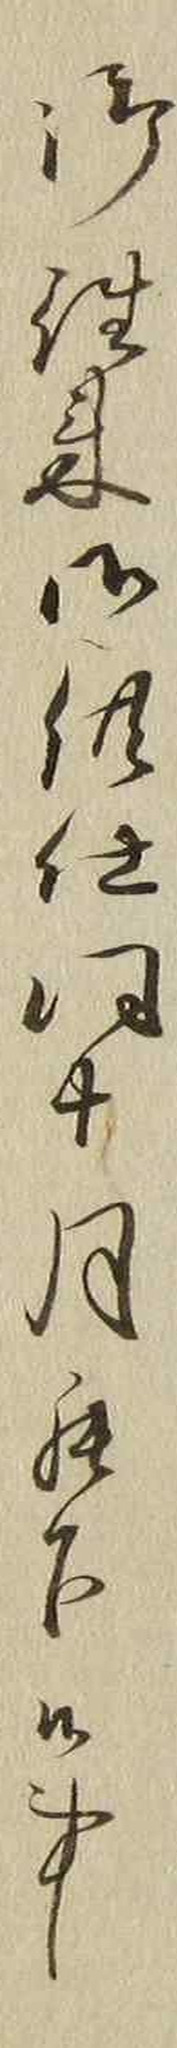御往来御供仕同十月罷下候事
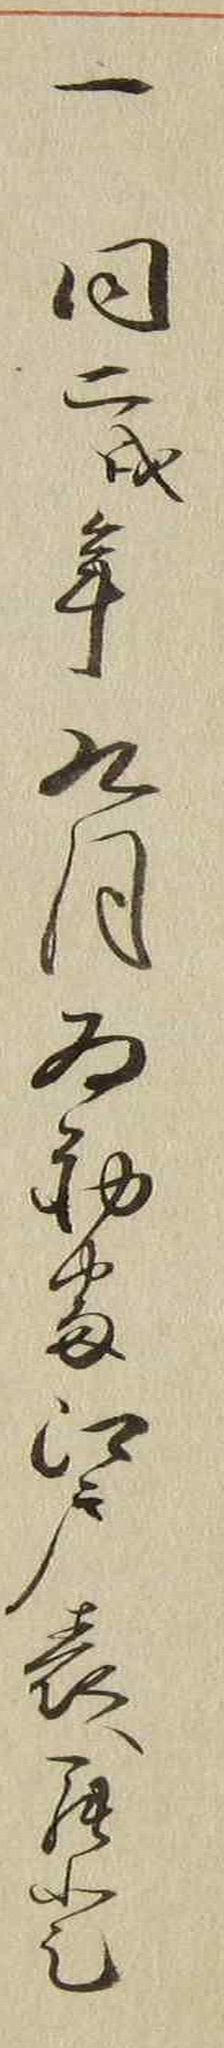一同二戌年九月為勤番江戸表へ罷登
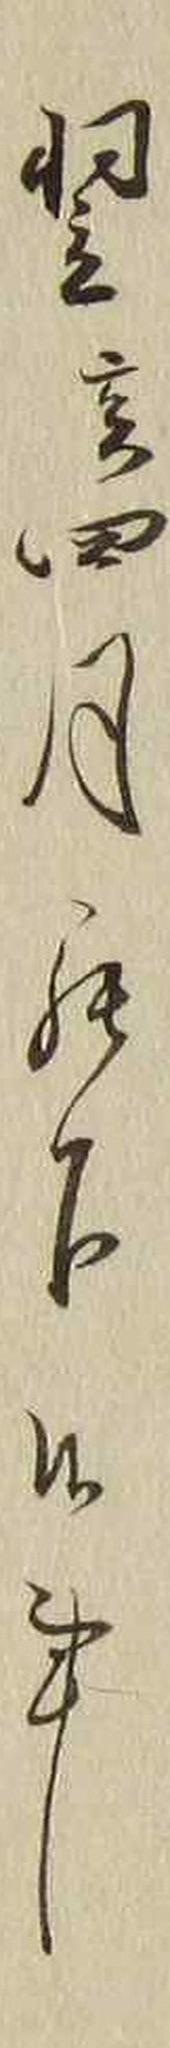翌亥年四月罷下候事
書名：諸士系譜　巻之68　を之部2
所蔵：会津若松市立会津図書館
